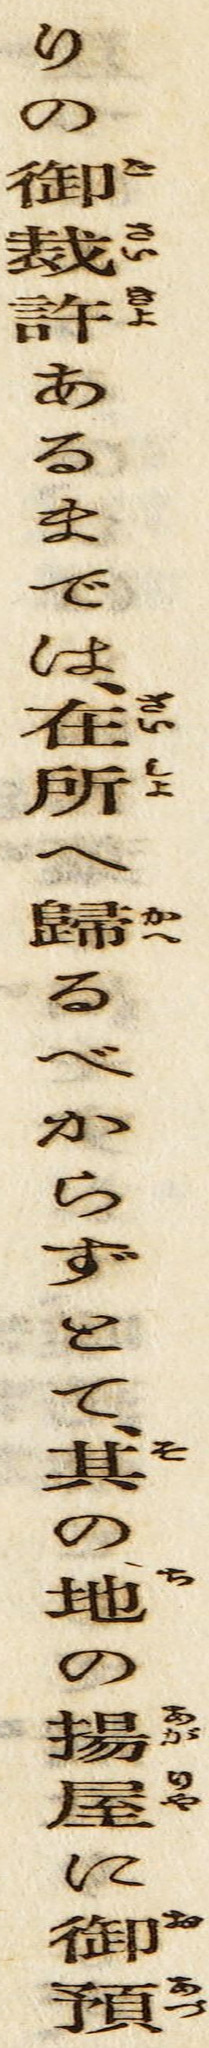りの御裁許あるまでは、在所へ帰るべからずとて、其の地の揚屋に御預
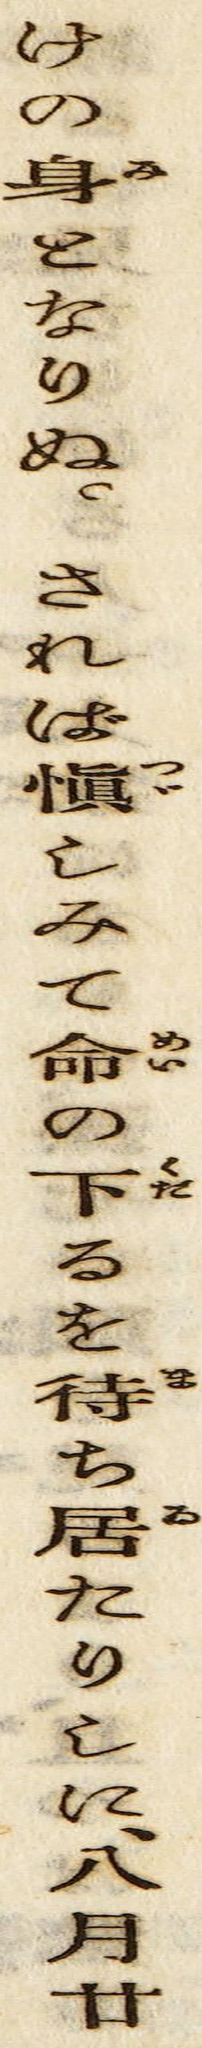けの身となりぬ。されば慎しみて命の下るを待ち居たりしに、八月廿
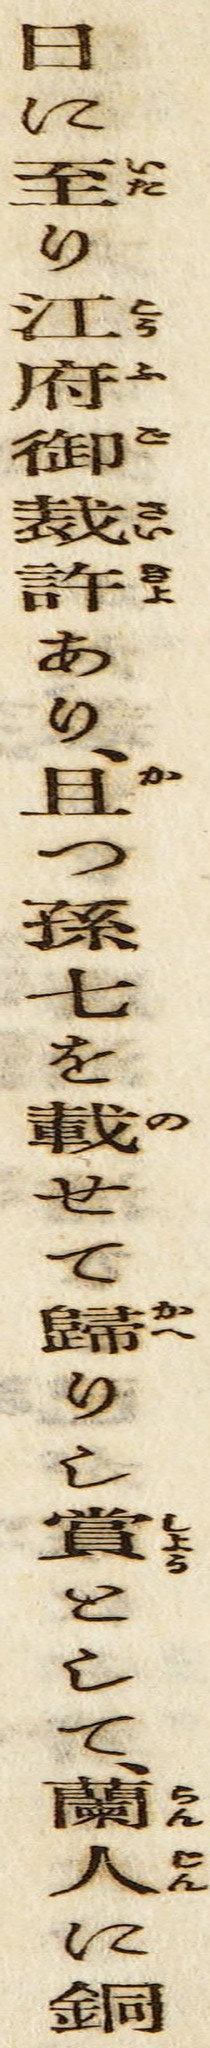日に至り江府御裁許あり、且つ孫七を載せて帰りし賞として、蘭人に銅
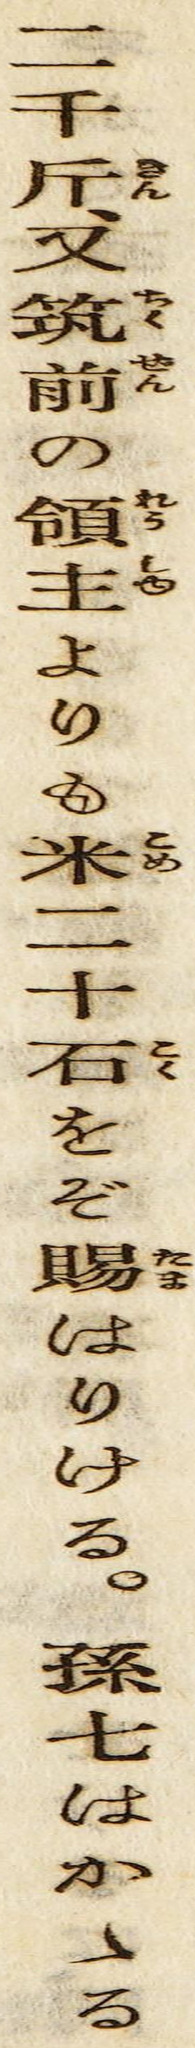二千斤、又筑前の領主よりも米二十石をぞ賜はりける。孫七はかゝる
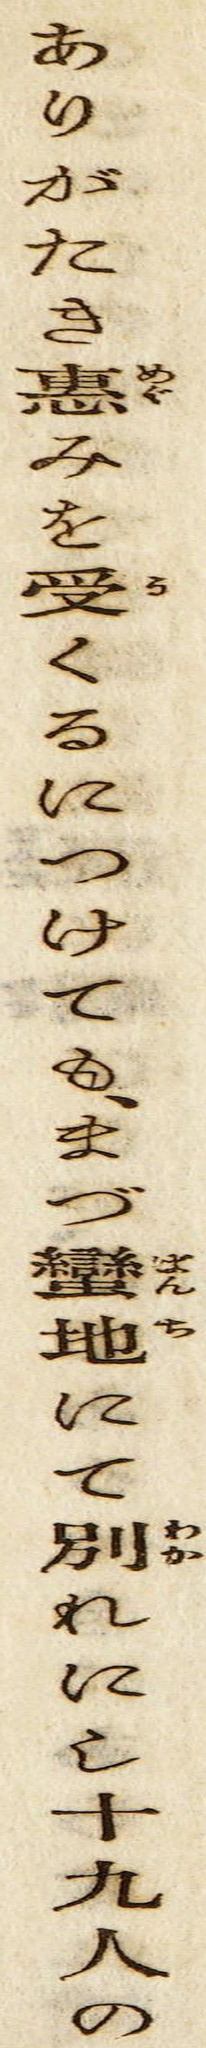ありがたき恵みを受くるにつけても、まづ蛮地にて別れにし十九人の

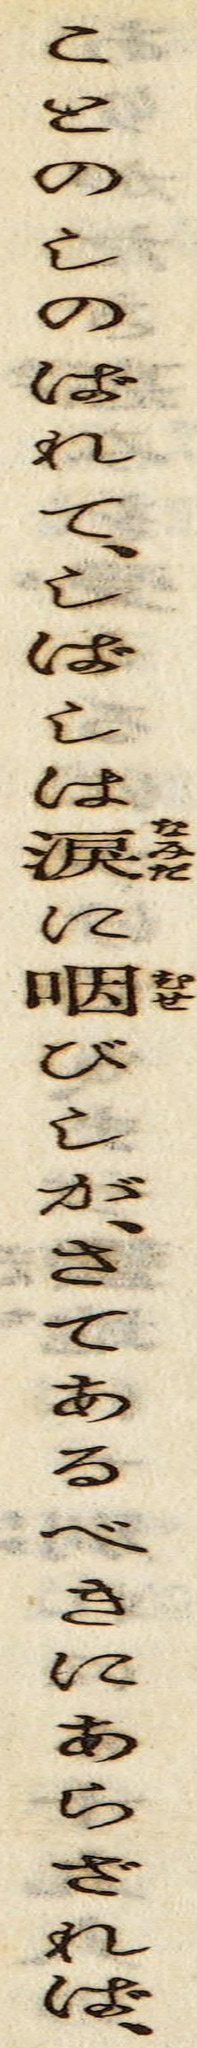ことのしのばれて、しばしは涙に咽びしが、さてあるべきにあらざれば、
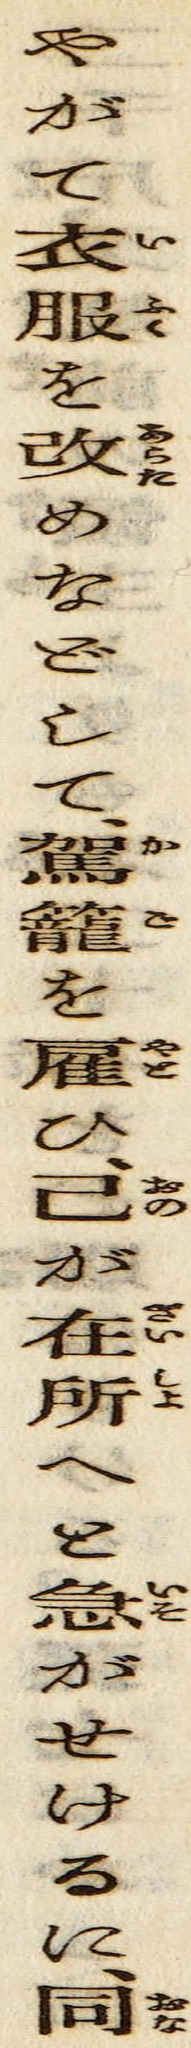やがて衣服を改めなどして、駕籠を雇ひ、己が在所へと急がせけるに、同
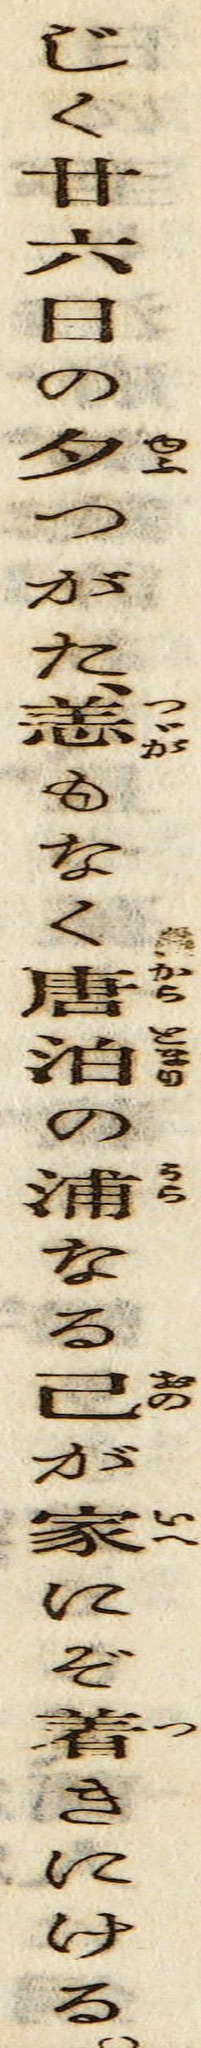じく廿六日の夕つがた、恙もなく唐泊の浦なる己が家にぞ着きにける。
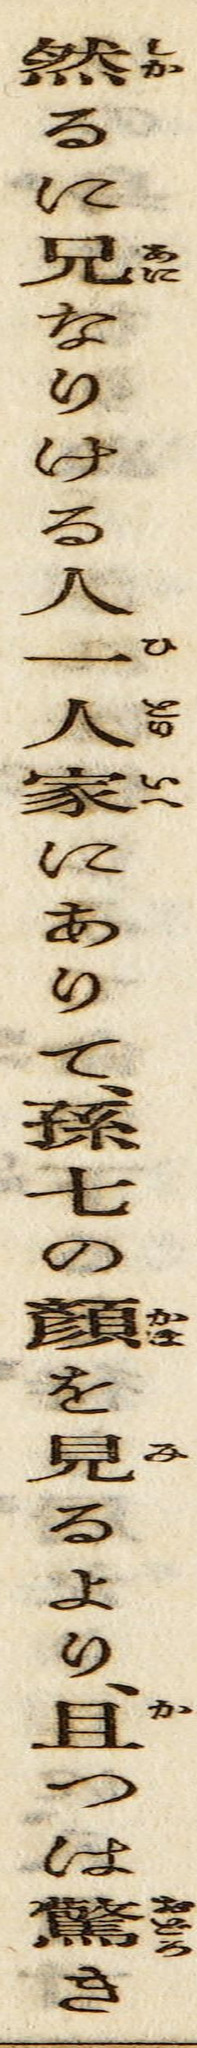然るに兄なりける人一人家にありて、孫七の顔を見るより、且つは驚き
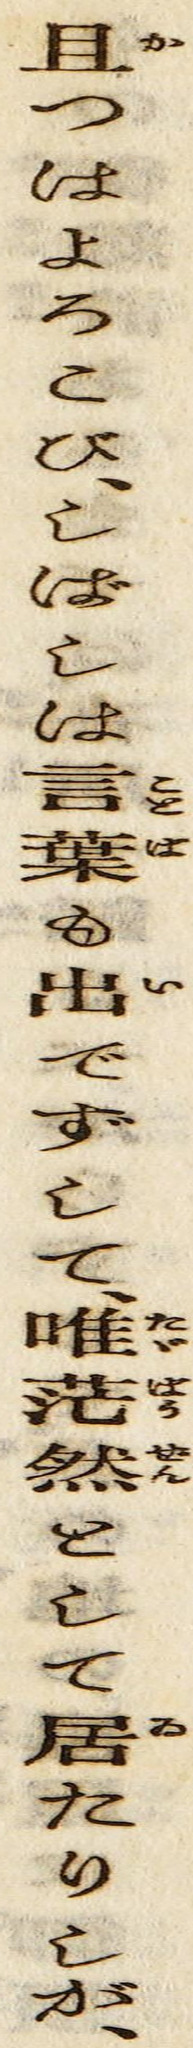且つはよろこび、しばしは言葉も出でずして、唯茫然として居たりしが、
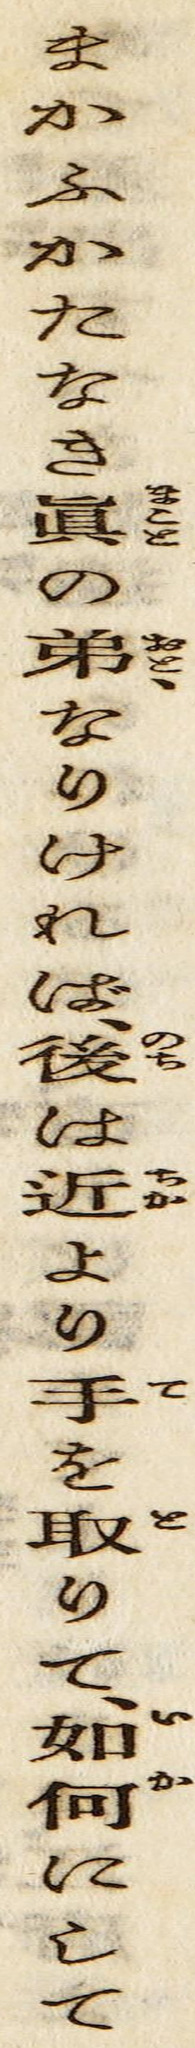まかふかたなき真の弟なりければ、後は近より手を取りて、如何にして
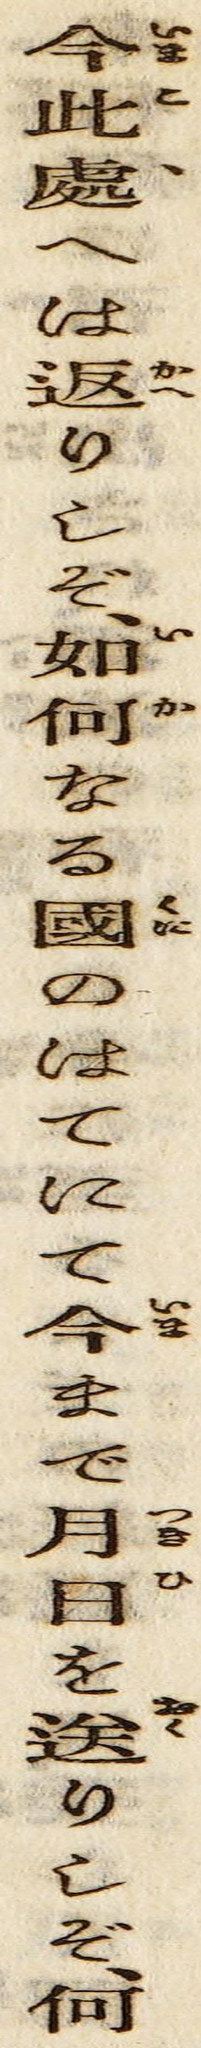今此処へは返りしぞ、如何なる国のはてにて今まで月日を送りしぞ、何
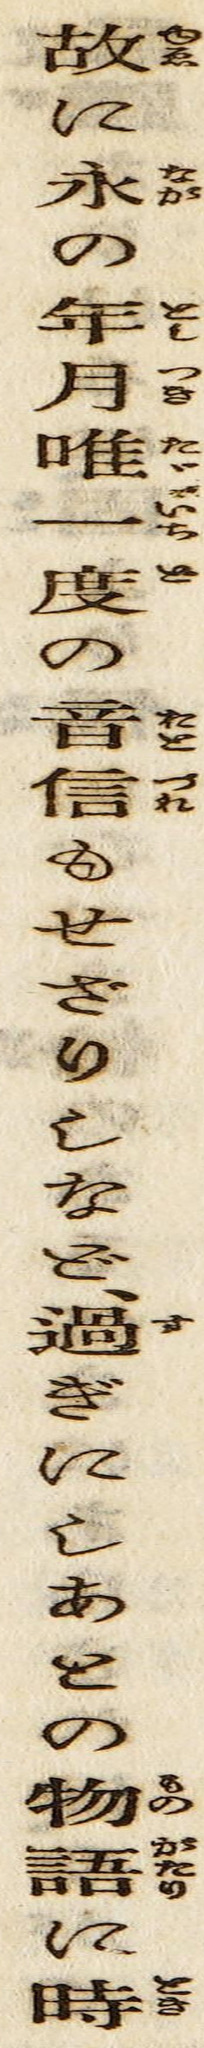故に永の年月唯一度の音信もせざりしなど、過ぎにしあとの物語に時
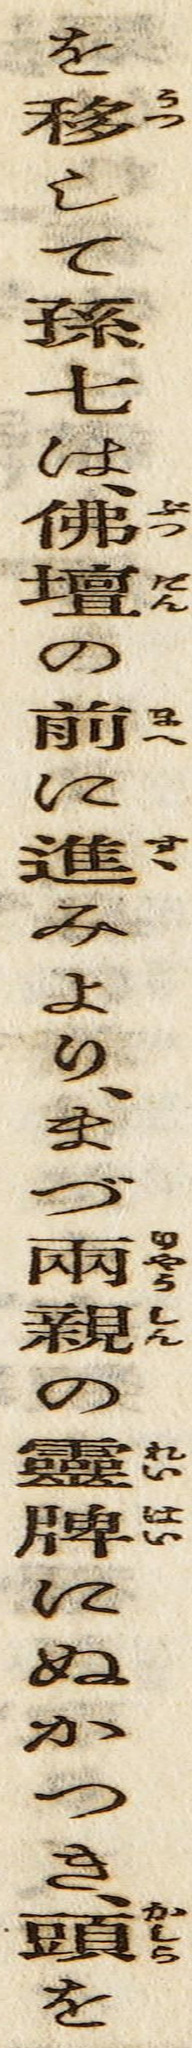を移して孫七は、仏壇の前に進みより、まづ両親の霊牌にぬかつき、頭を
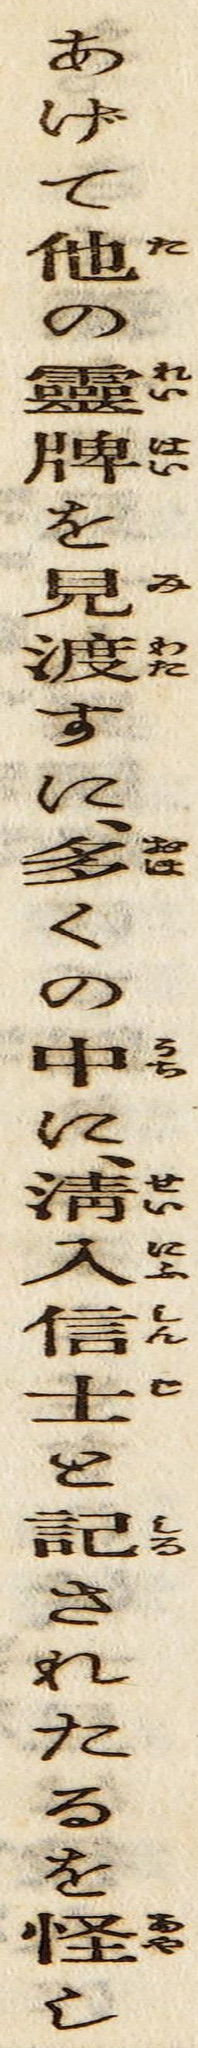あげて他の霊牌を見渡すに、多くの中に、清入信士と記されたるを怪し
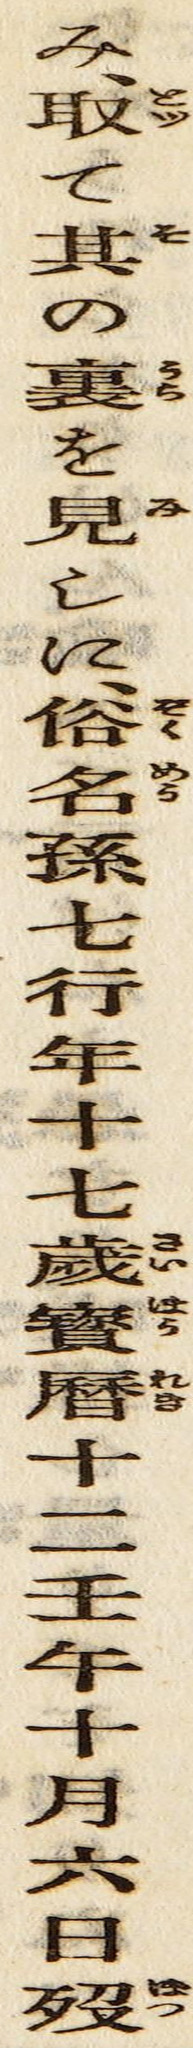み、取て其の裏を見しに、俗名孫七行年十七歳宝暦十二壬午十月六日歿
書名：日本漂流譚
